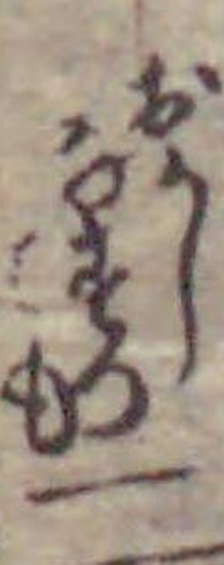なすつ
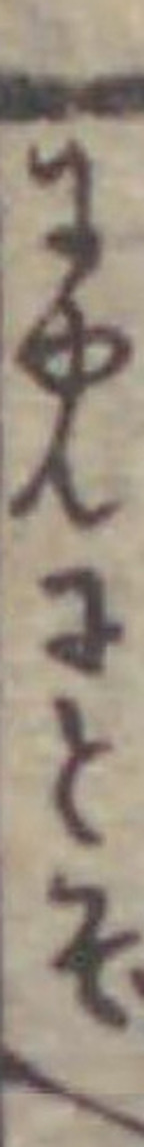にやんにとぞ
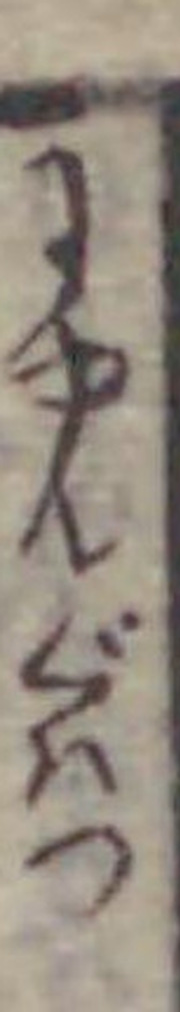にゃんぐはつ
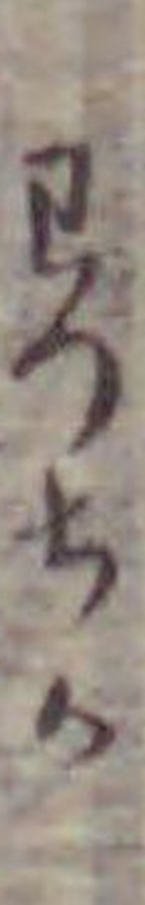わつちか
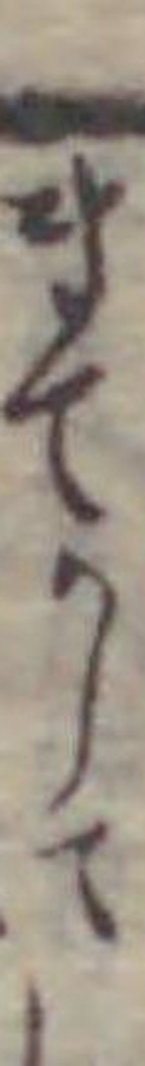までかして
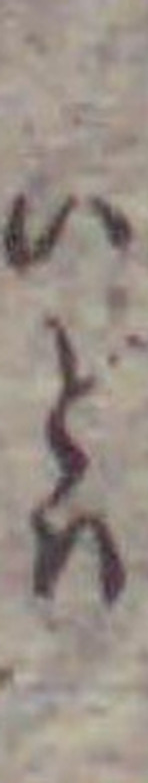いどは
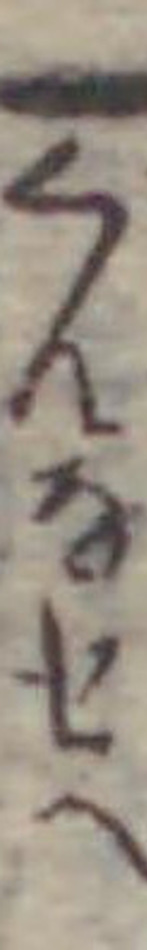くんなせへ
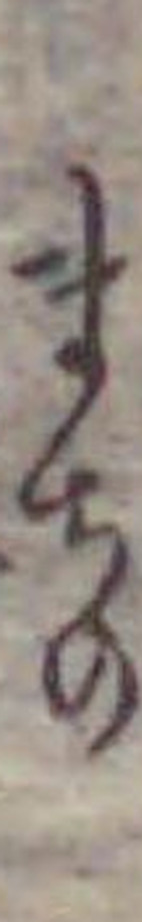まちの
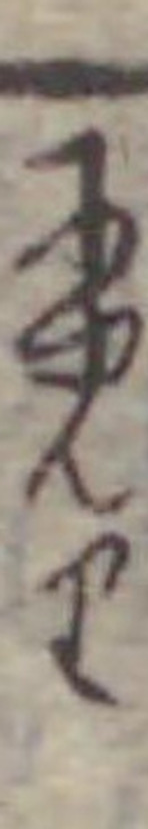にゃんり
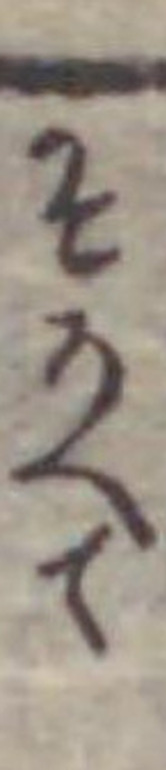そろへて
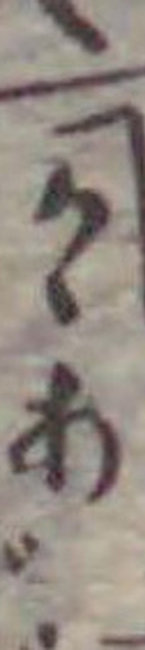〽かゝあ
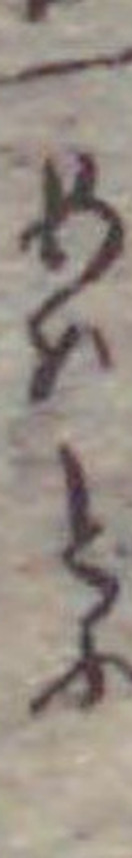めはどぶ
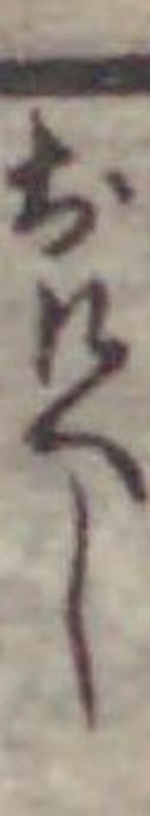おけへし
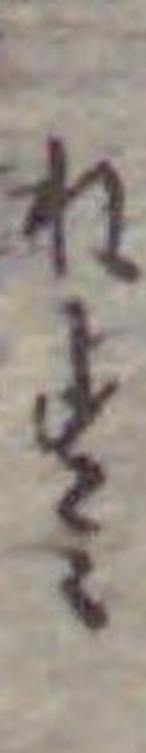ねすみ
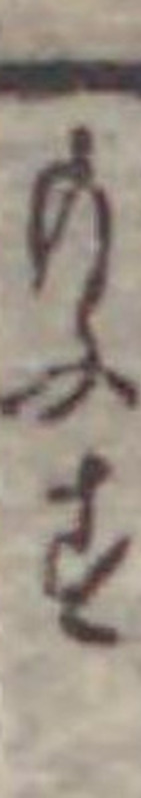もふす
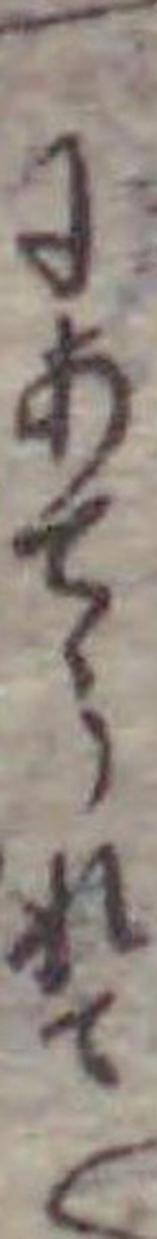にあてられて
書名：化物見世開 : 2巻
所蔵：国立国会図書館 National Diet Library, JAPAN
